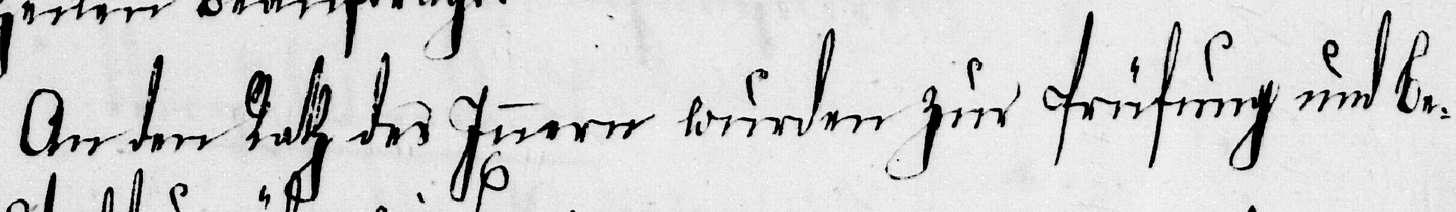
An den Rath des Innern wurden zur Prüfung und Be¬
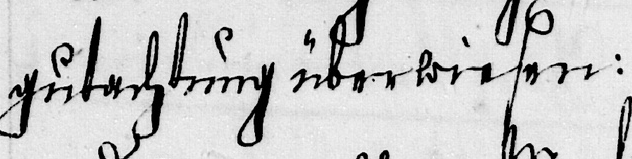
gutachtung überwiesen:
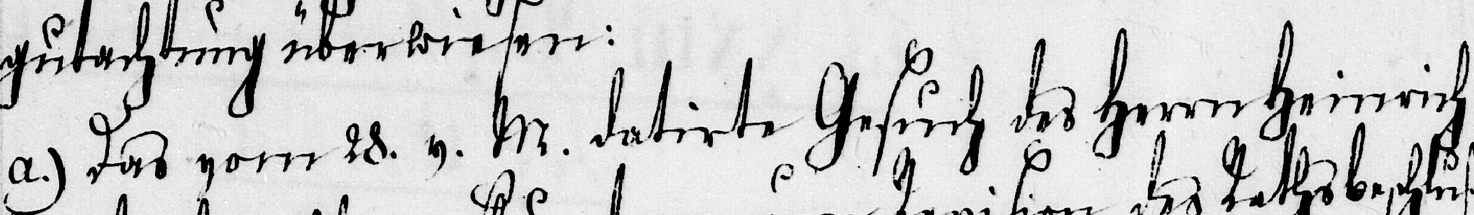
a.) Das vom 28. v. M. datirte Gesuch des Herrn Heinrich
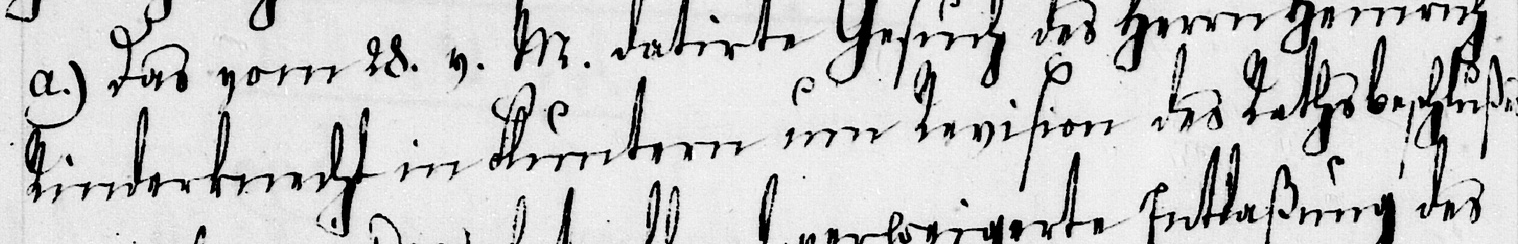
Rinderknecht in Fluntern um Revision des Rathsbeschluß¬
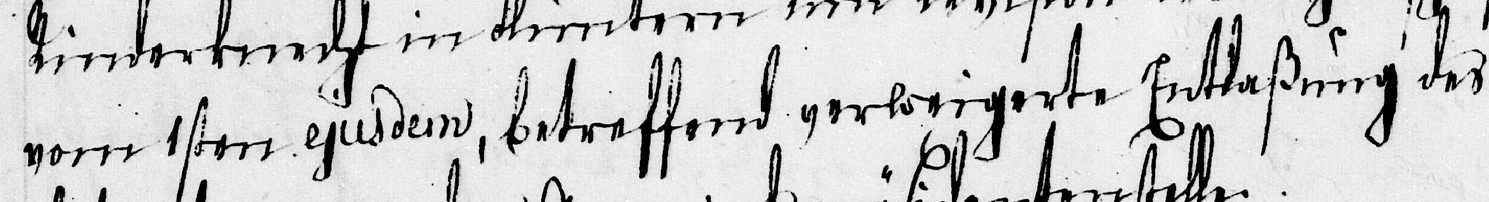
vom 1sten ejusdem, betreffend verweigerte Entlaßung des
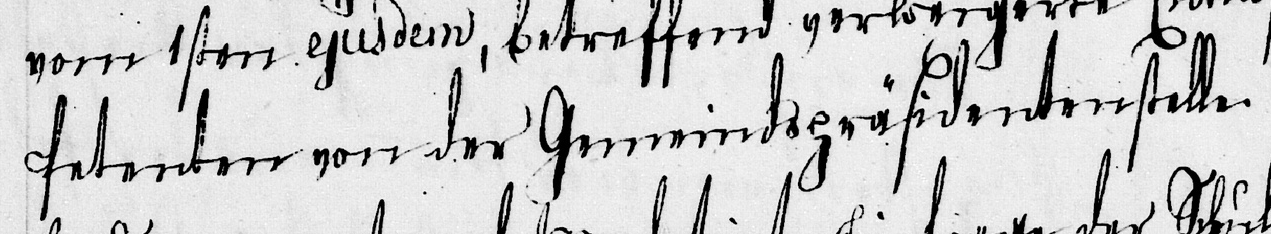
Petenten von der Gemeindspräsidentenstelle.
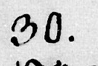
80.
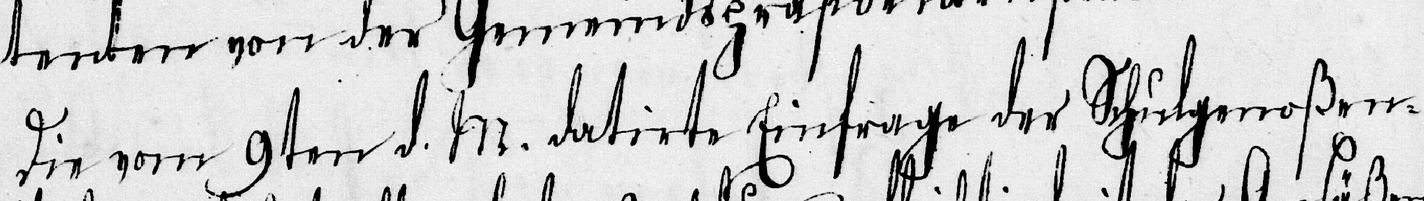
Die vom 9ten d. M. datirte Einfrage der Schulgenoßen¬
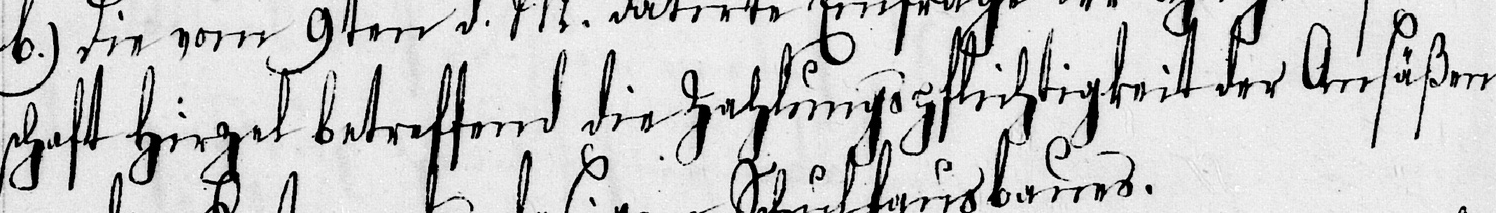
schaft Hirzel betreffend die Zahlungspflichtigkeit der Ansäßen
